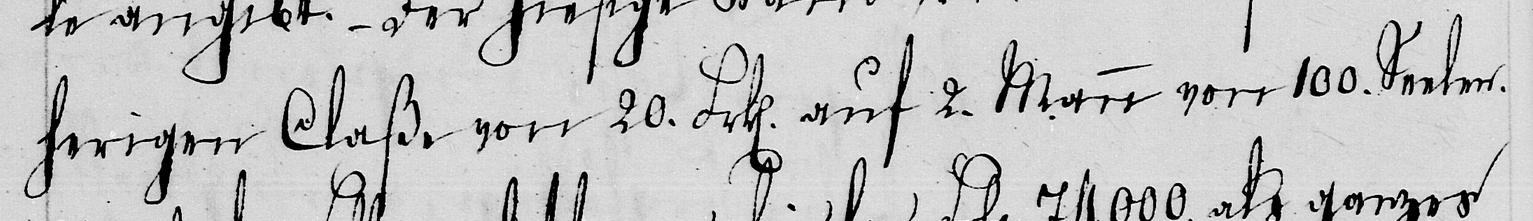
herigen Claße von 20. Frk[en]. auf 2. Mann von 100. Seelen.
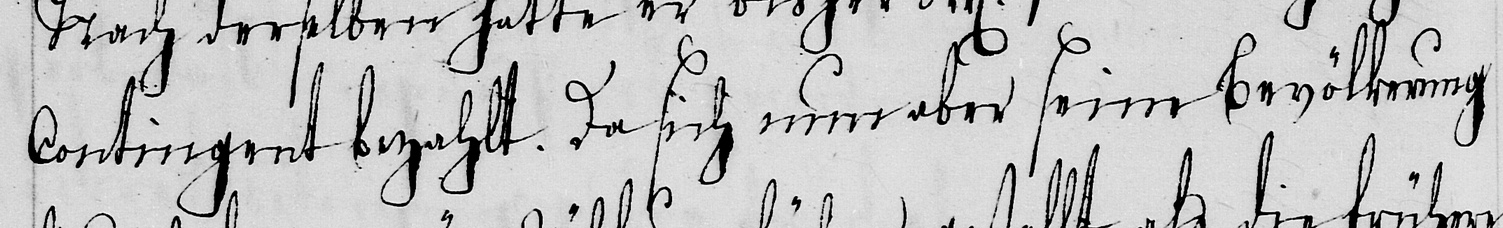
Contingent bezahlt. Da sich nun aber seine Bevölkerung
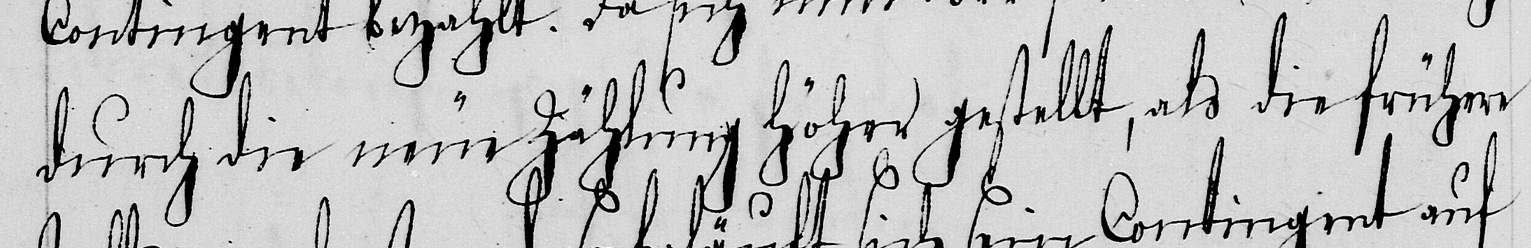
durch die neue Zählung Höher gestellt, als die
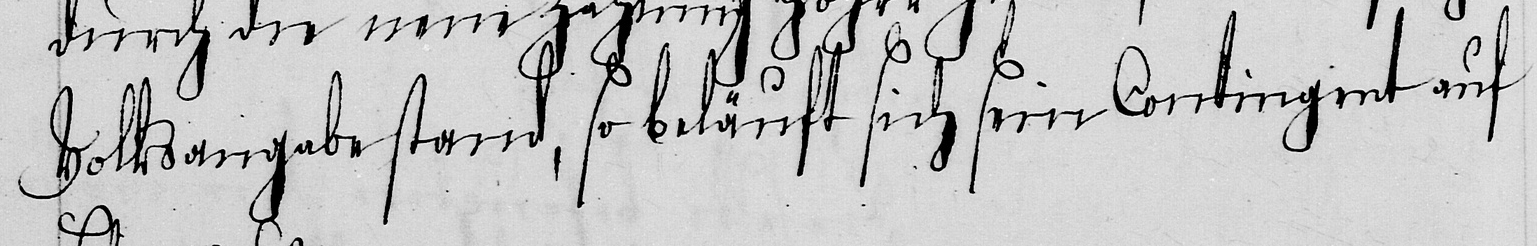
Volksangabe stand, so beläuft sich sein Contingent auf
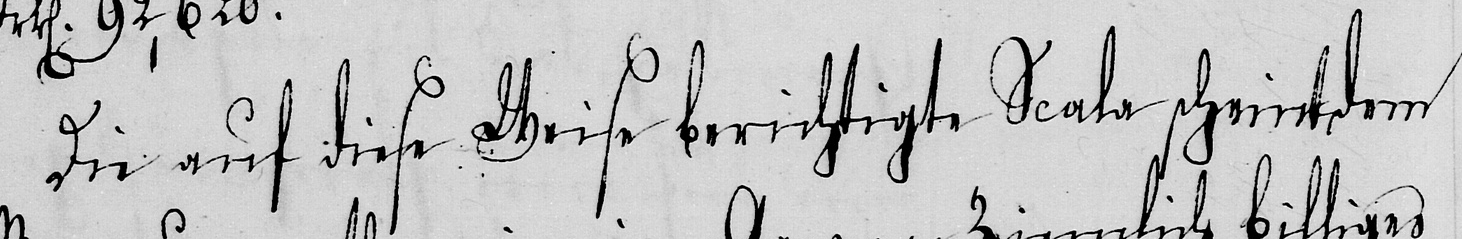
Die auf diese Weise berichtigte Scala scheint dem
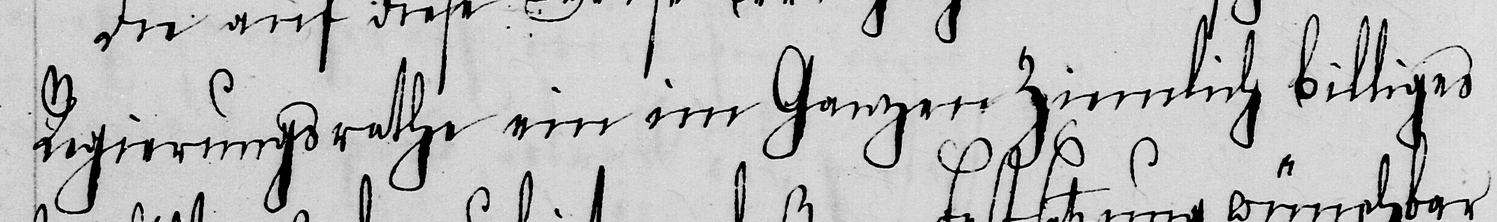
Regierungsrathe ein im Ganzen ziemlich billiges
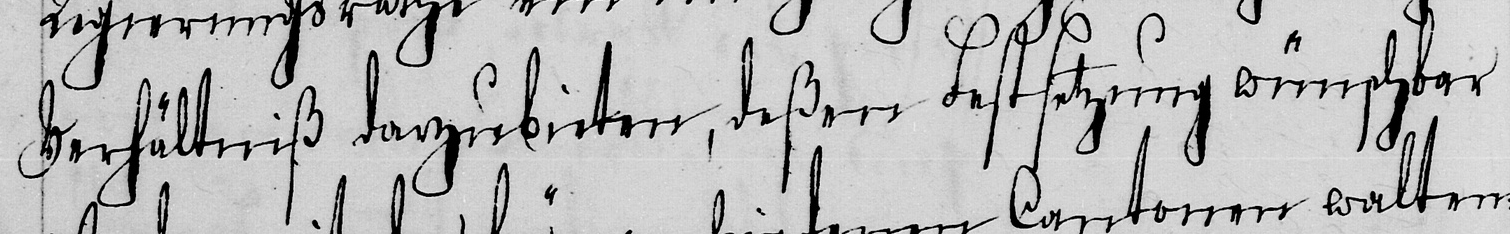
Verhältniß darzubieten, deßen Festsetzung wünschbar
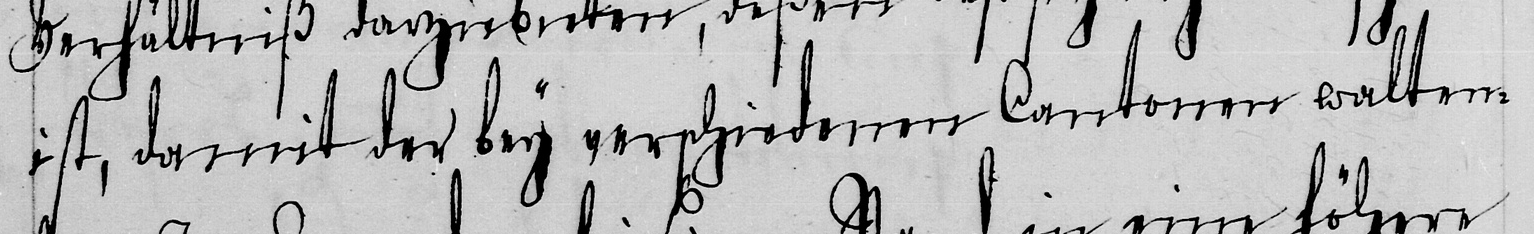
ist, damit der bey verschiedenen Cantonen walten¬
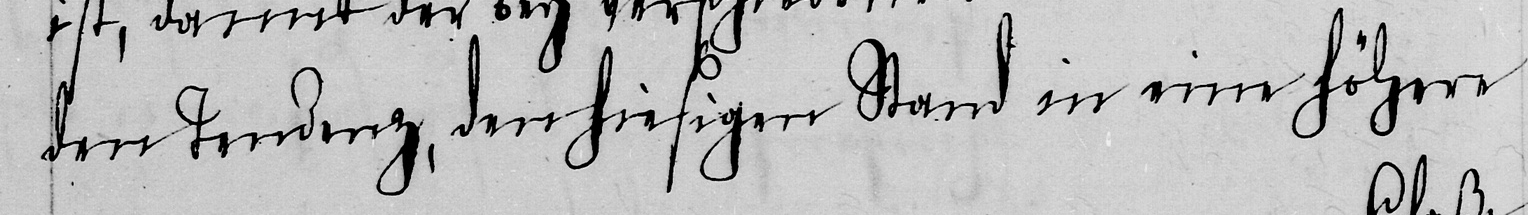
den Tendenz, den hiesigen Stand in eine höhere
